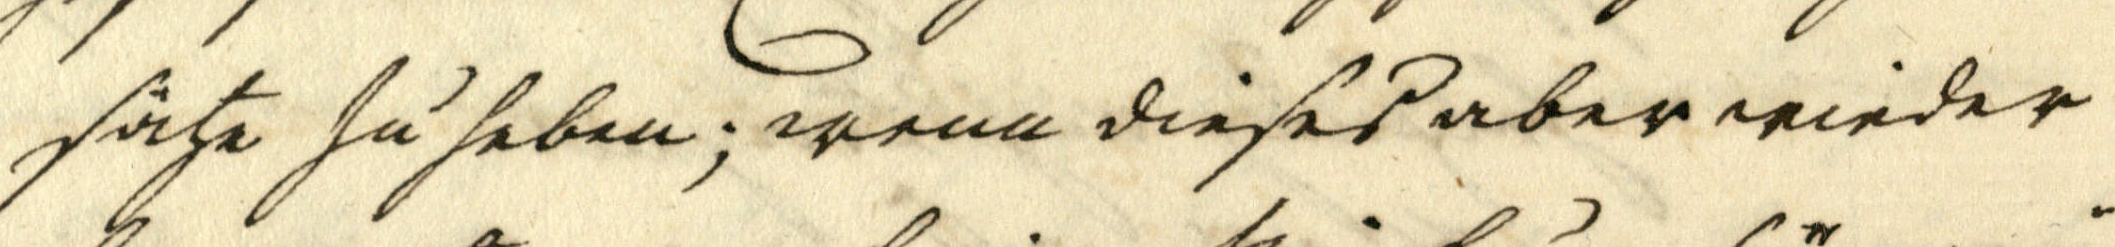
sätze zu haben, wenn dieses aber wieder
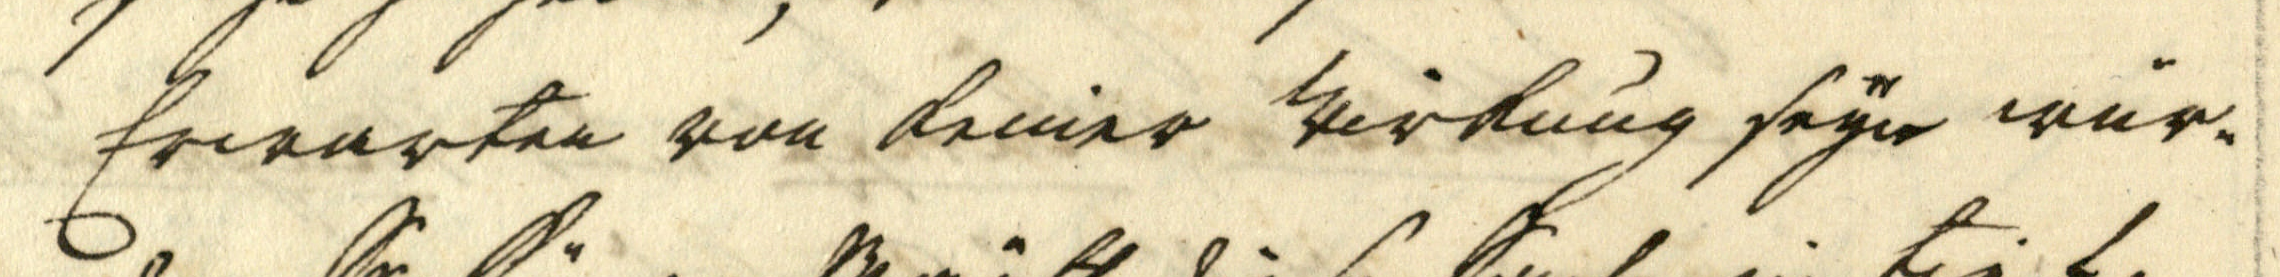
Erwarten von keiner Wirkung seÿn wür¬
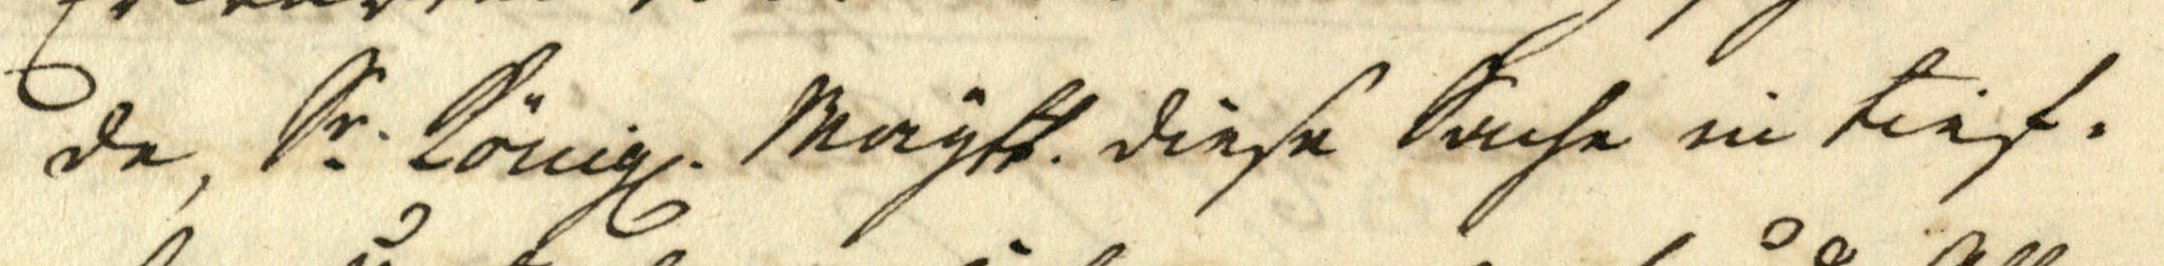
de, Sr. Königl. Maÿtt. diese Sache in tief¬
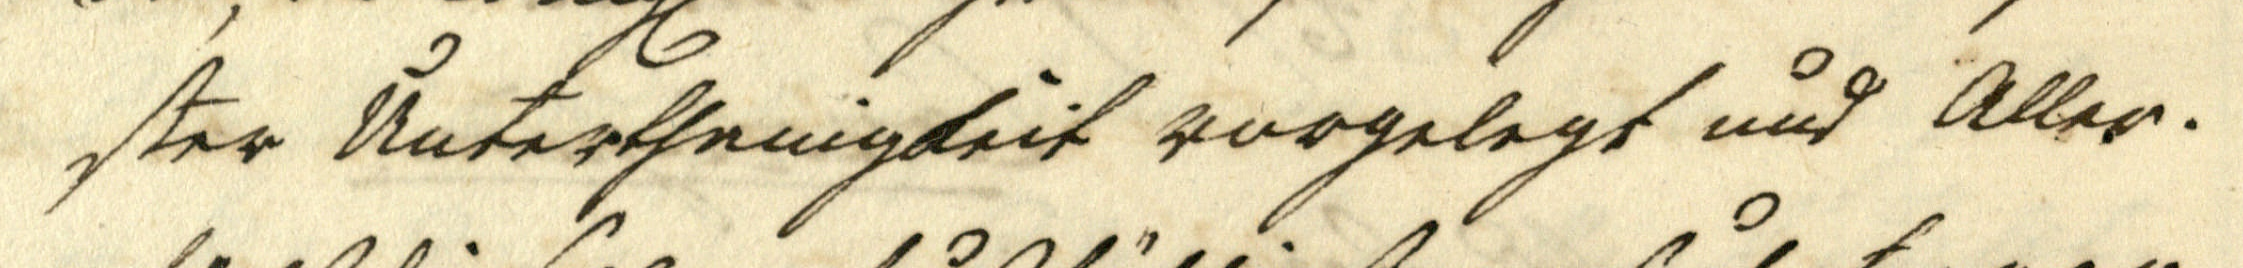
ster Unterthänigkeit vorgelegt und Aller¬
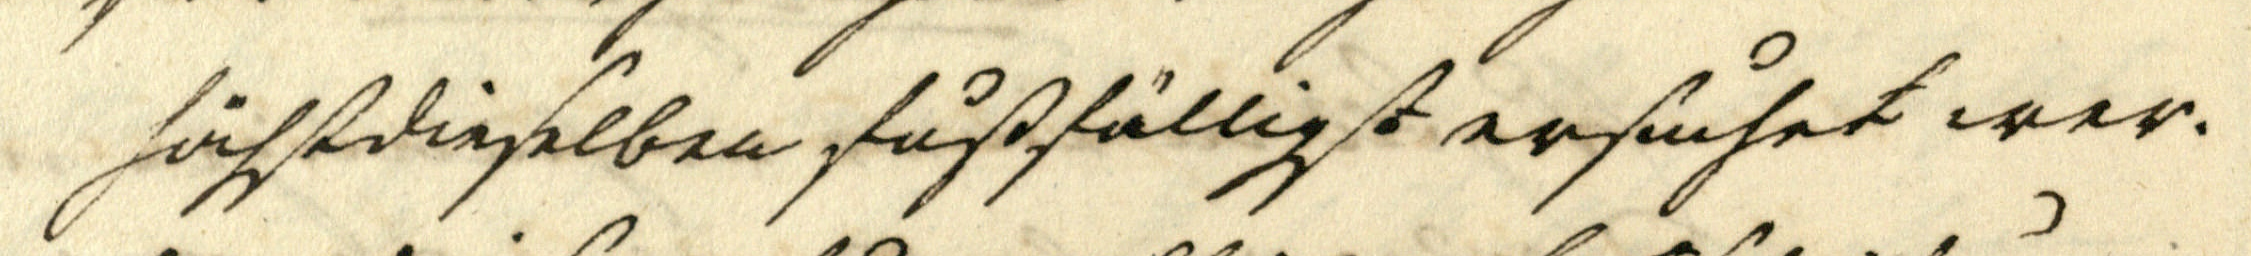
höchstdieselben fußfälligst ersuchet wer¬
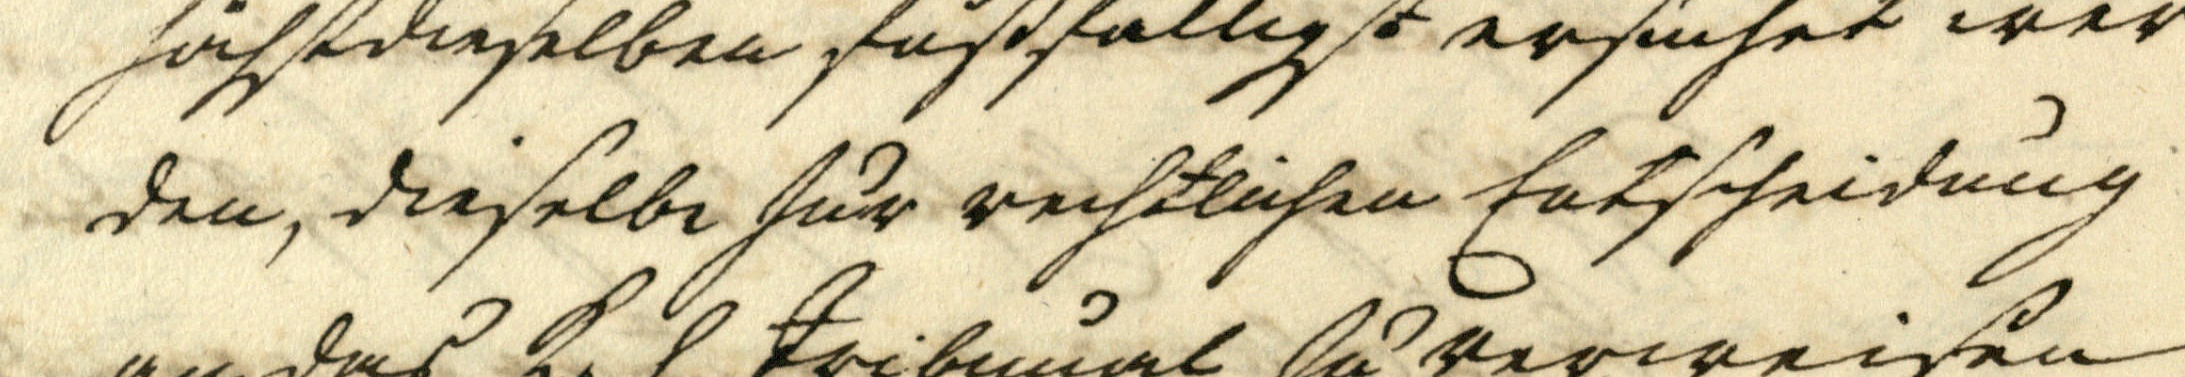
den, dieselbe zur rechtlichen Entscheidung
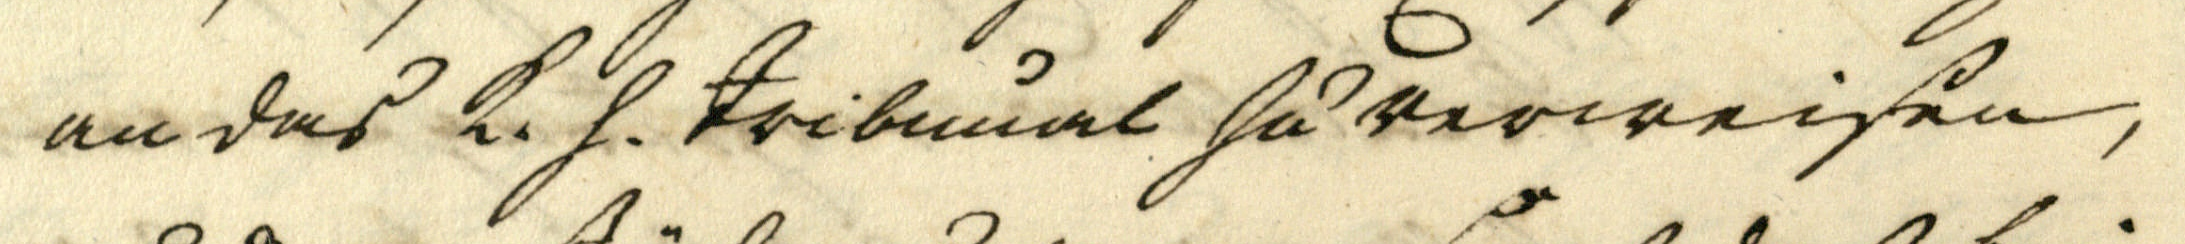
an das K. H. Tribunal zu verweisen,
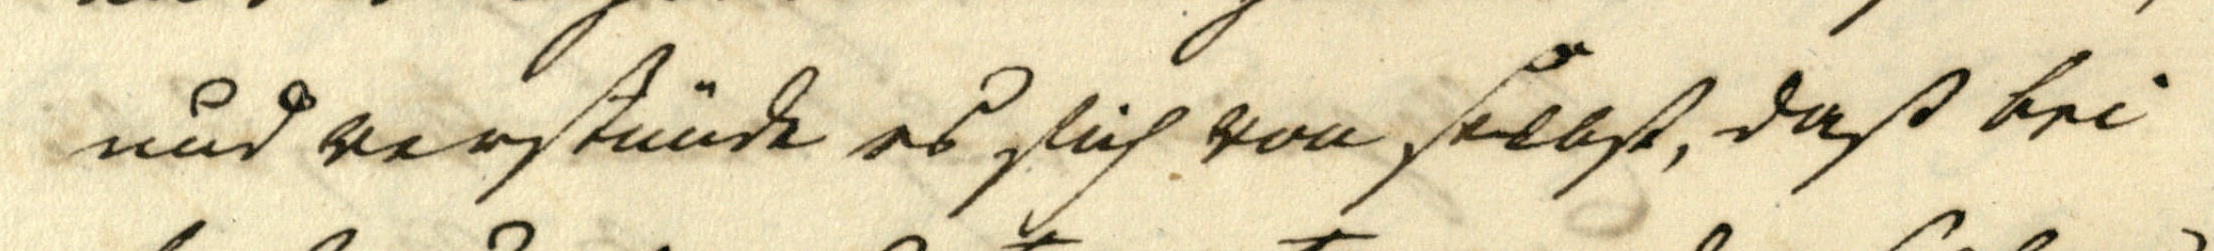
und verstünde es sich von selbst, daß bei
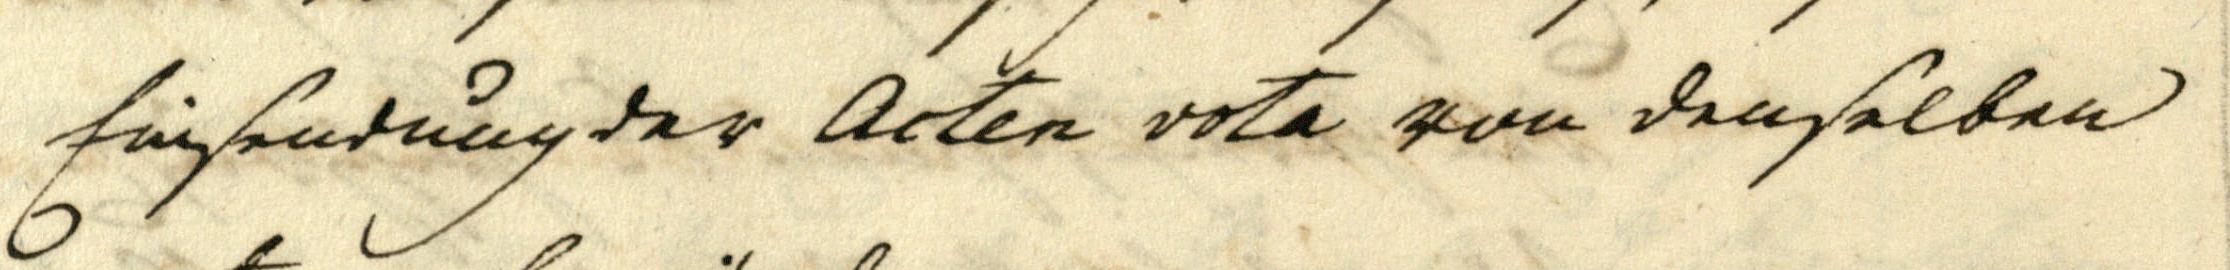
Einsendung der Acten vota von denselben
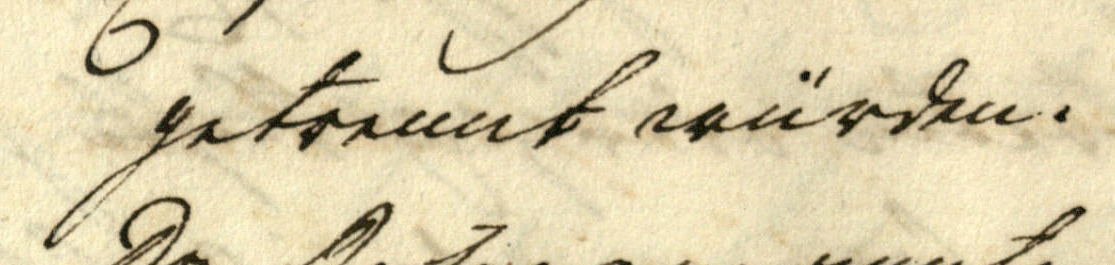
getrennt würden.
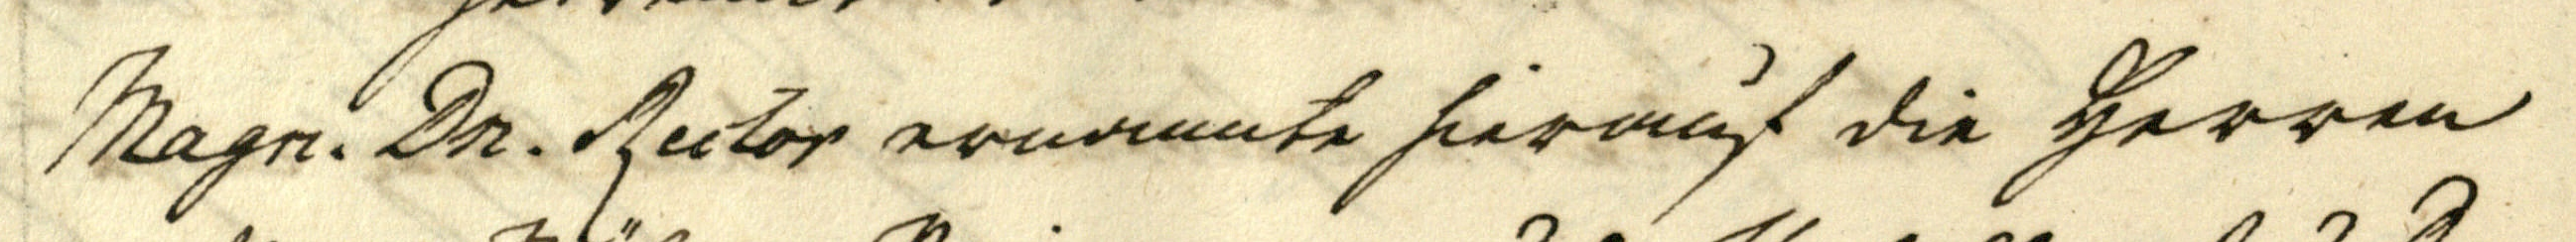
Magn. Dn. Rector ernannte hierauf die Herren
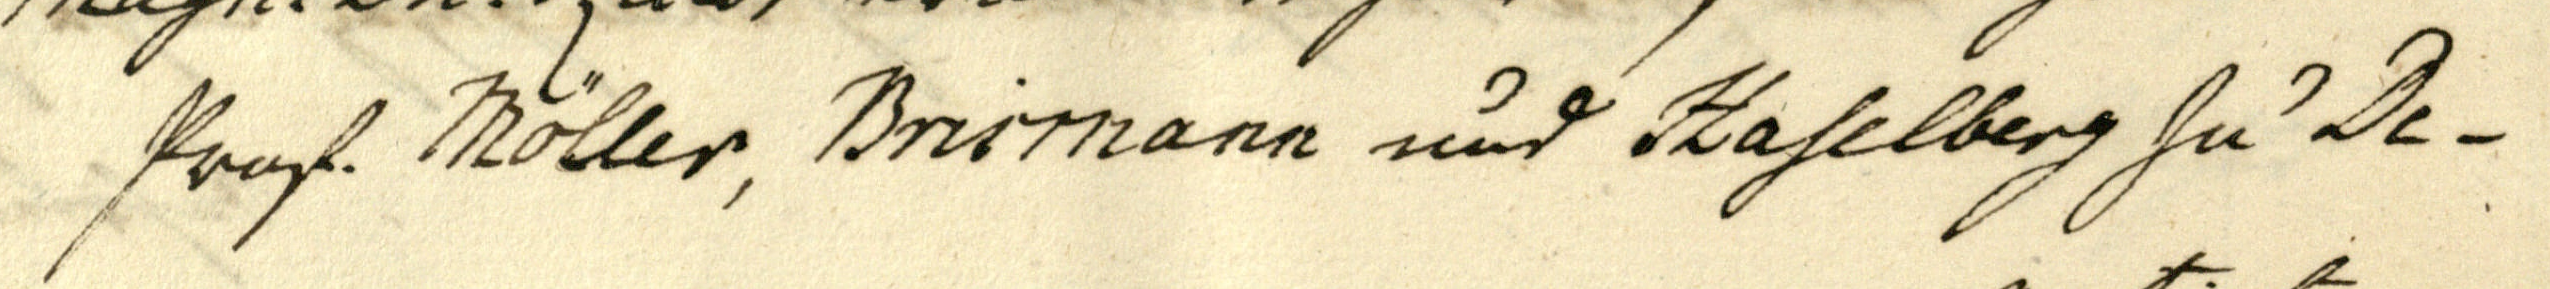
Prof. Möller, Brismann und Haselberg zu De¬
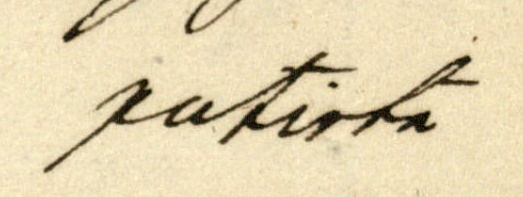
putirte
